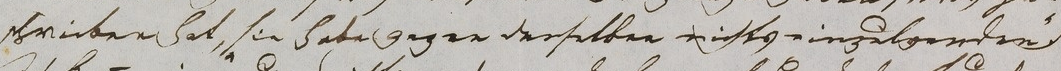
schrieben hat, «sie habe gegen denselben nichts einzuwenden».)
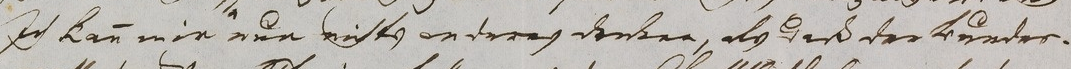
Ich kann mir nun nichts anderes denken, als daß der Bundes-
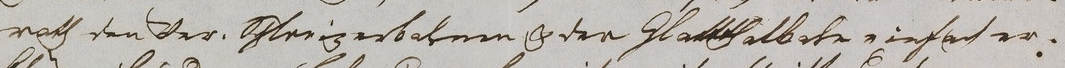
rath den Ver. Schweizerbahnen & der Glattthalbahn einfach er-
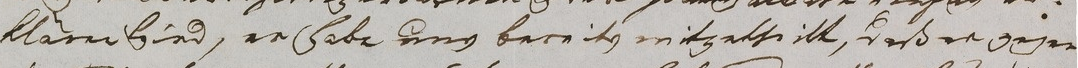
klären wird, er habe uns bereits mitgetheilt, daß er gegen
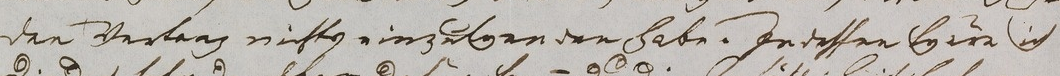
den Vertrag nichts einzuwenden haben. Indessen wäre ich
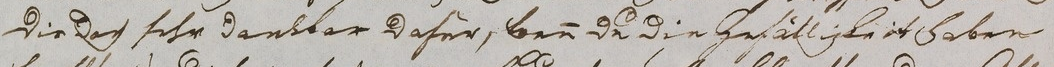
Dir doch sehr dankbar dafür, wenn Du die Gefälligkeit haben
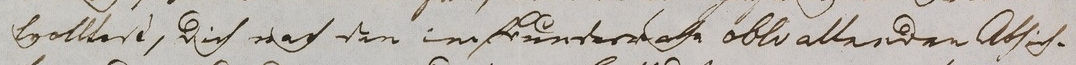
wolltest, Dich nach den im Bundesrathe obwaltenden Absich-
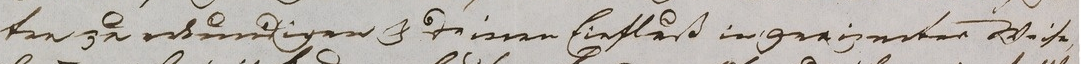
ten zu erkundigen & Deinen Einfluß in geeigneter Weise,
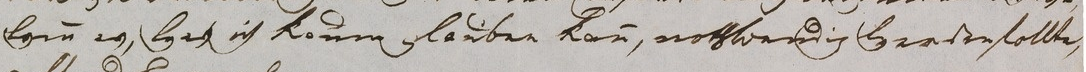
wenn es, was ich kaum glauben kann, nothwendig werden sollte,
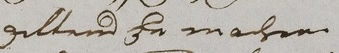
geltend zu machen.
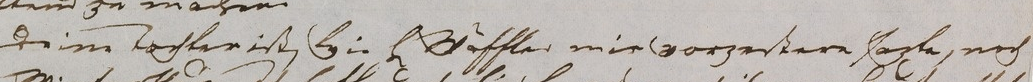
Deine Tochter ist, wie H. Wäffler mir vorgestern sagte, noch
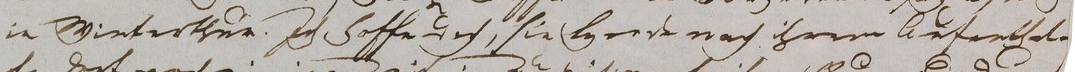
in Winterthur. Ich hoffe doch, sie werde nach ihrem Aufenthal-
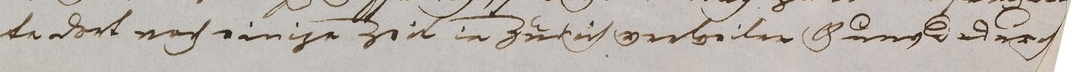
te dort noch einige Zeit in Zürich verweilen & uns dadurch
